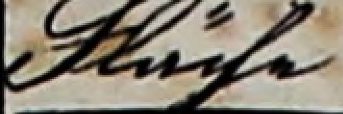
Fläche
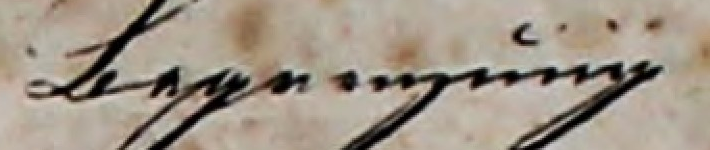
Begrenzung
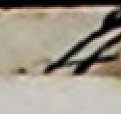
J.
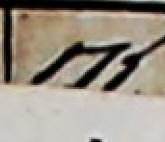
CK.
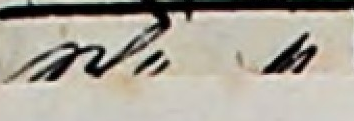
???
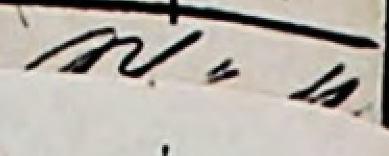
???
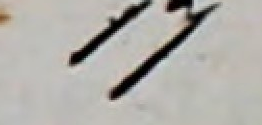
17
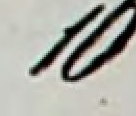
16
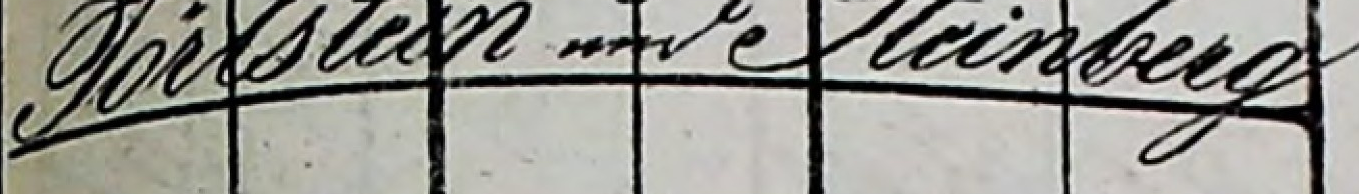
Törlstein und Steinberg
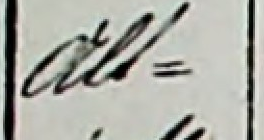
Alt=
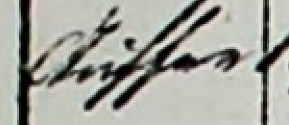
Aussee
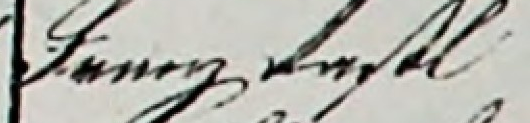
Franz ?astl
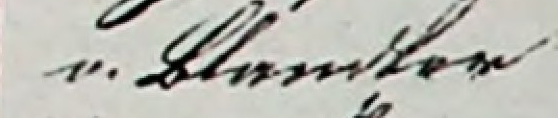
v. Blandter
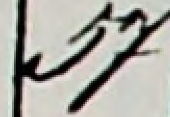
57
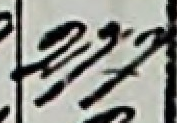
277
